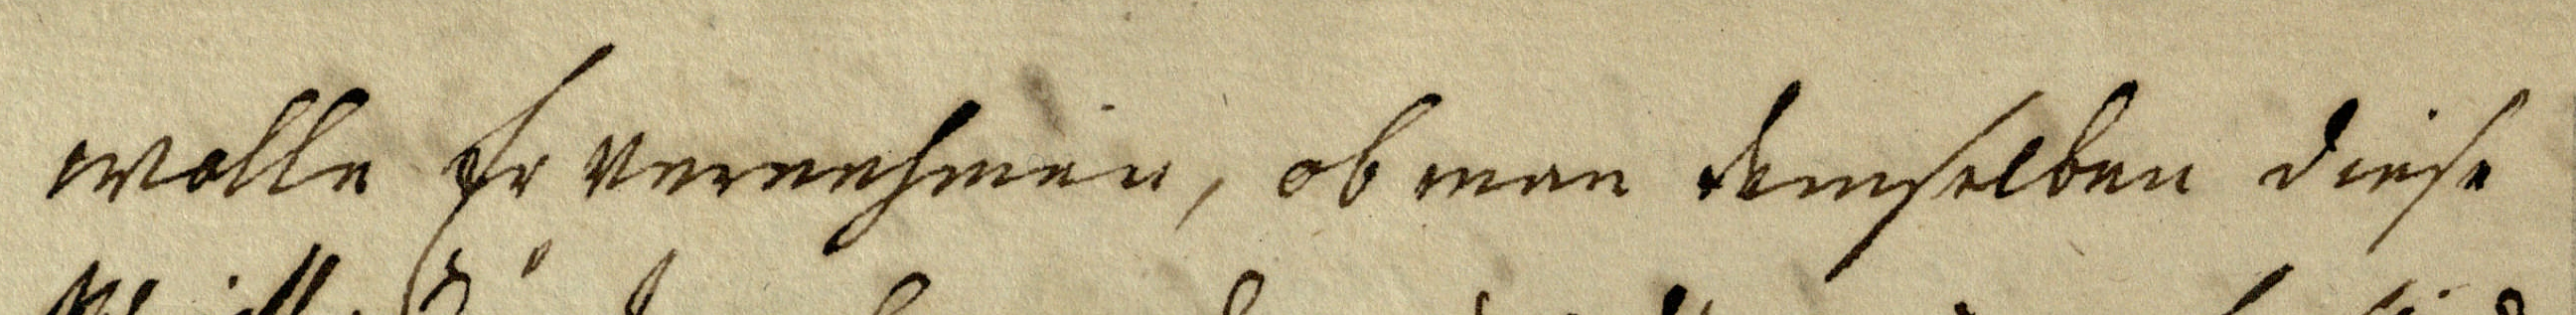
wolle Er vernehmen, ob man demselben diese
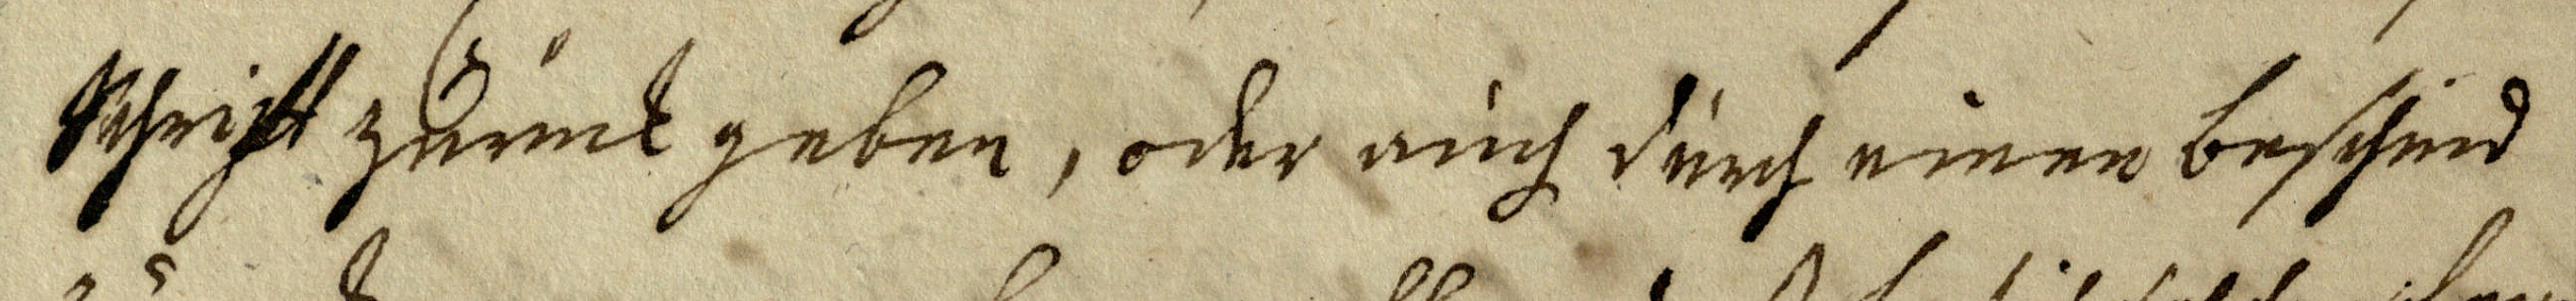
Schrift zurück geben, oder auch durch einen Bescheid
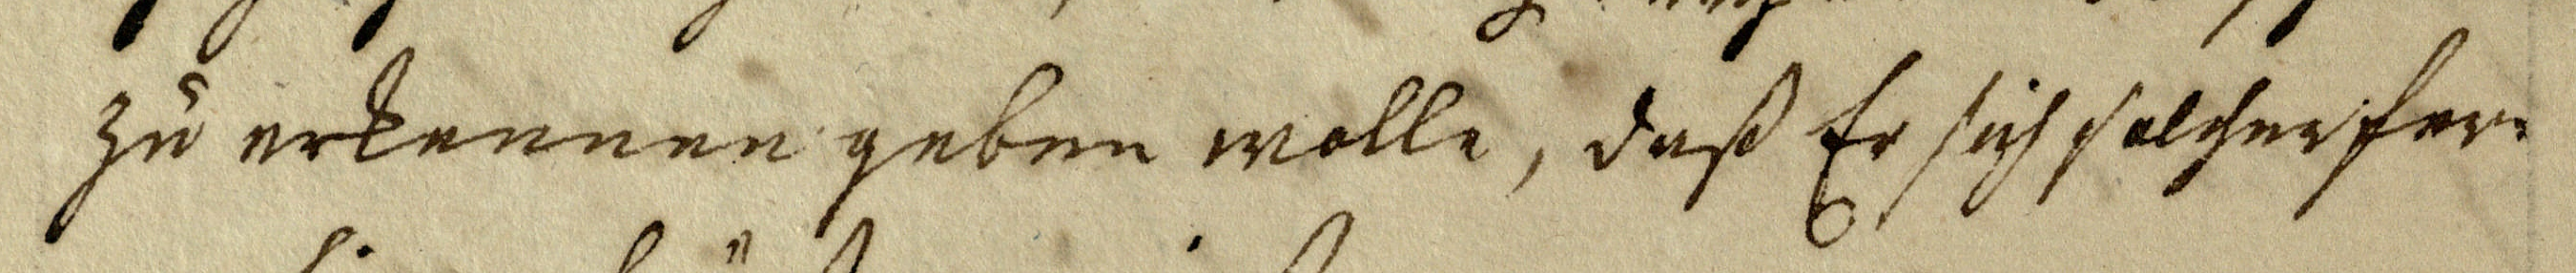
zu erkennen geben wolle, daß Er sich solcher für¬
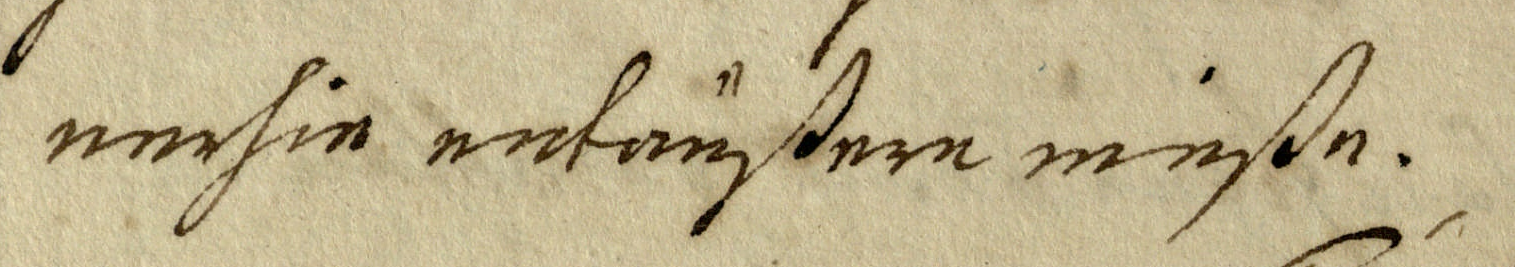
nerhin entäußern müße.
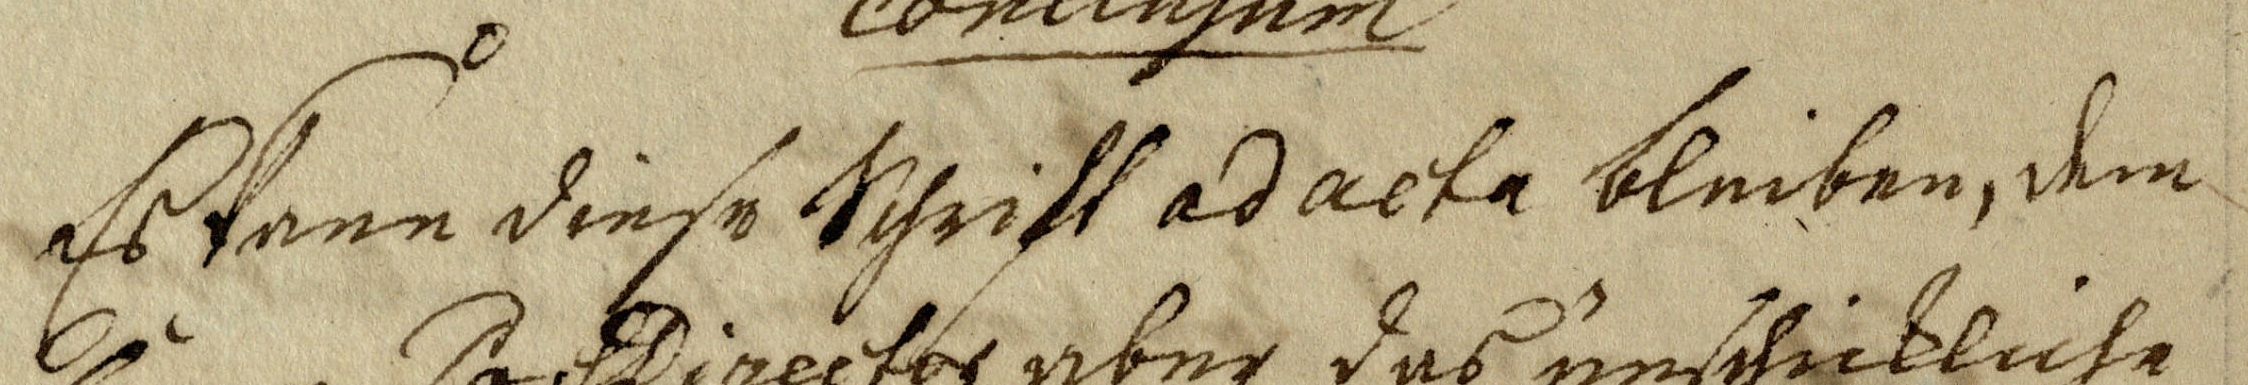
Es kann diese Schrift ad acta bleiben, dem
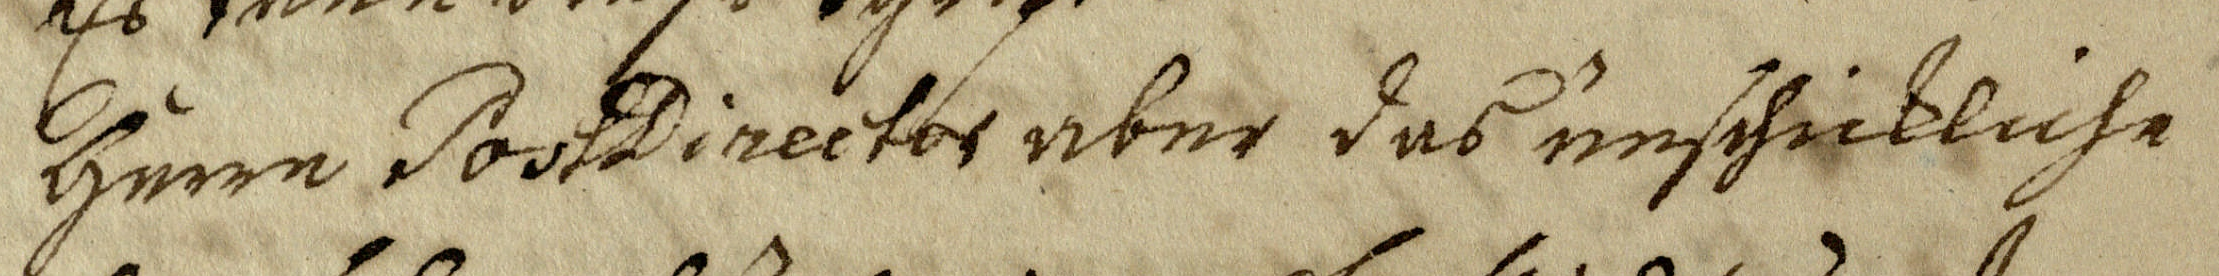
Herrn PostDirector aber das unschickliche
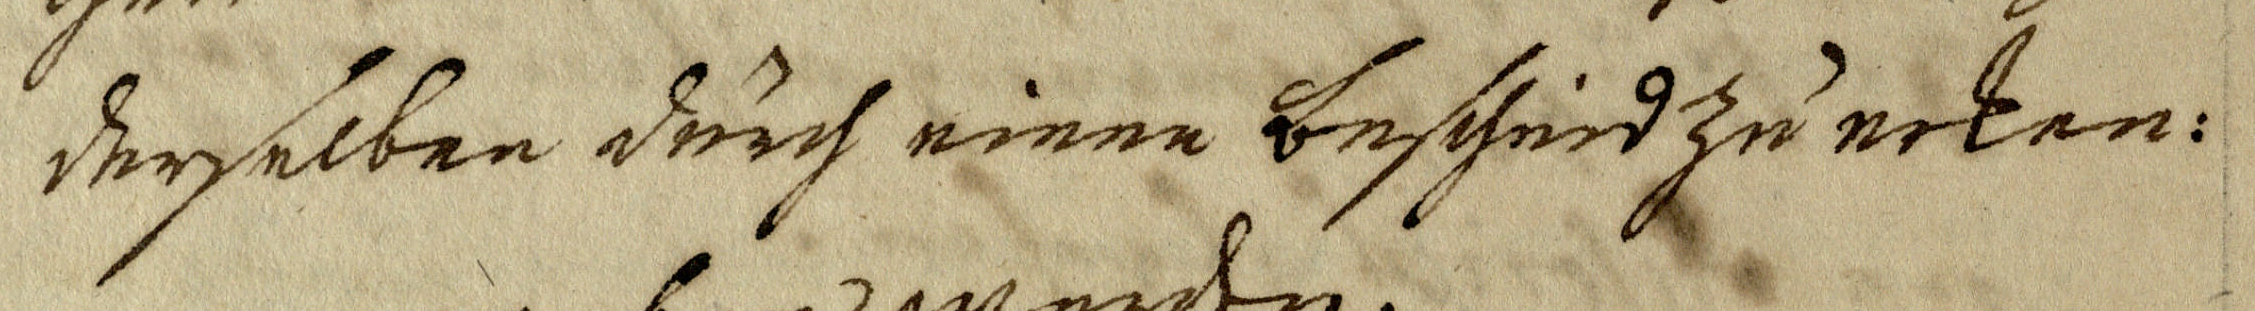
derselben durch einen Bescheid zu erken¬
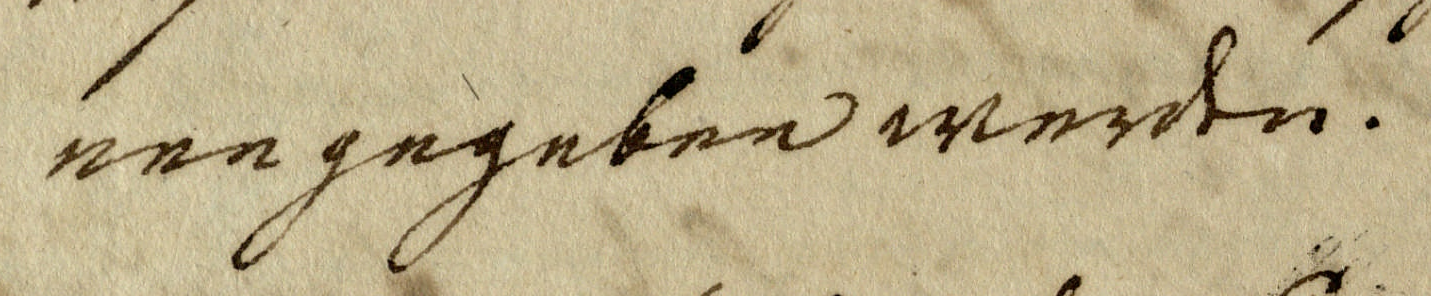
nen gegeben werden.
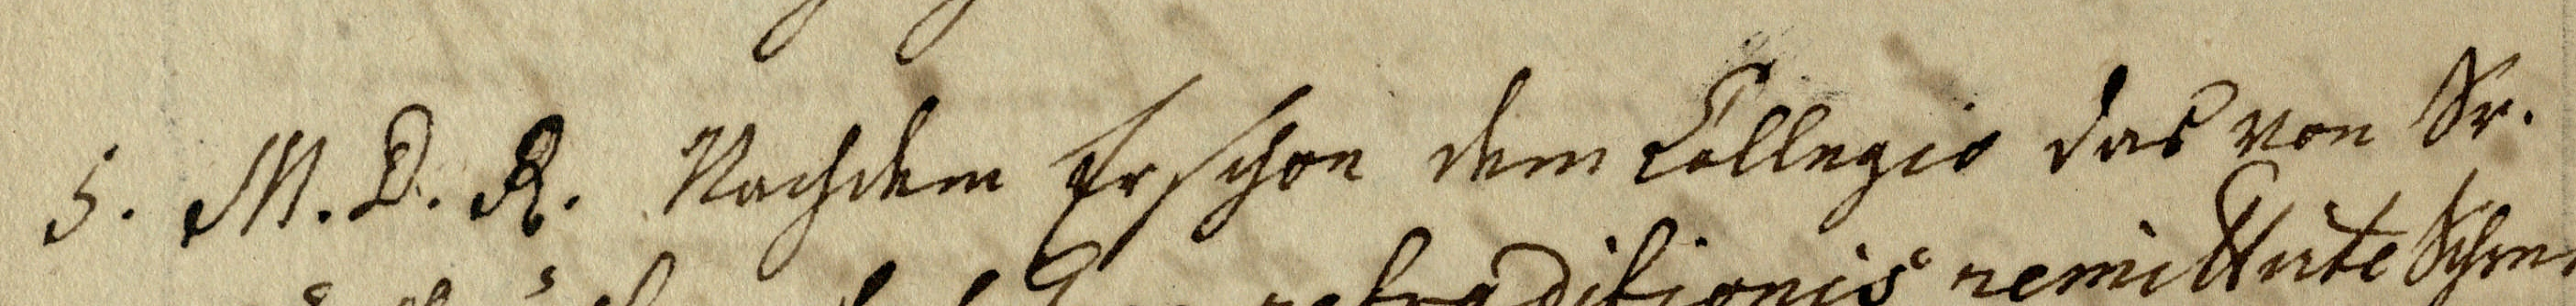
5. M. D. R. Nachdem Er schon dem Collegio das von Sr.
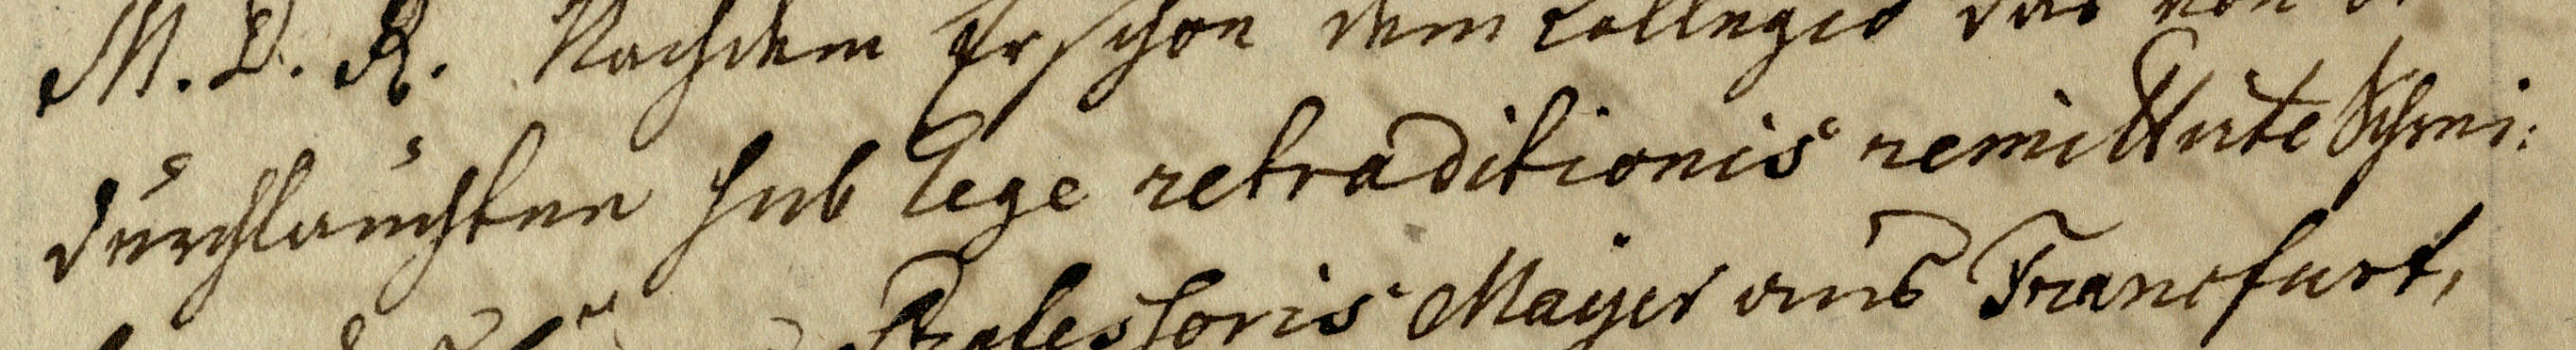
Durchlauchten sub lege retraditionis remittirte Schrei¬
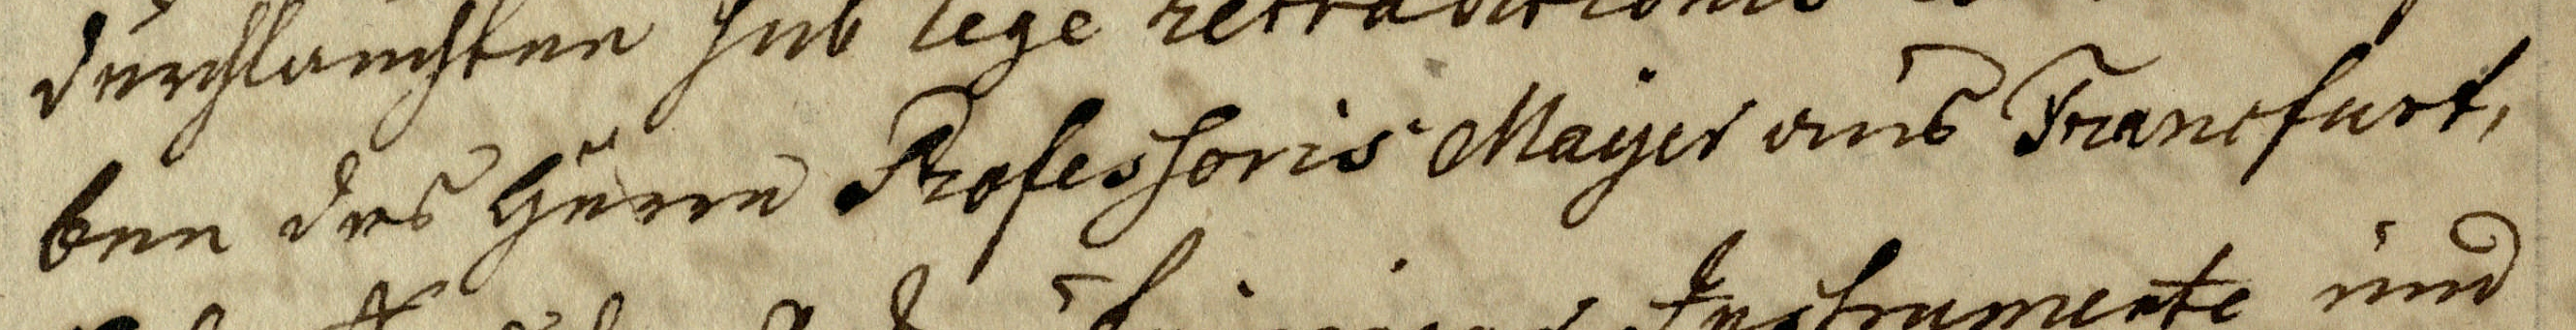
ben des Herrn Professoris Maÿer aus Frankfurt,
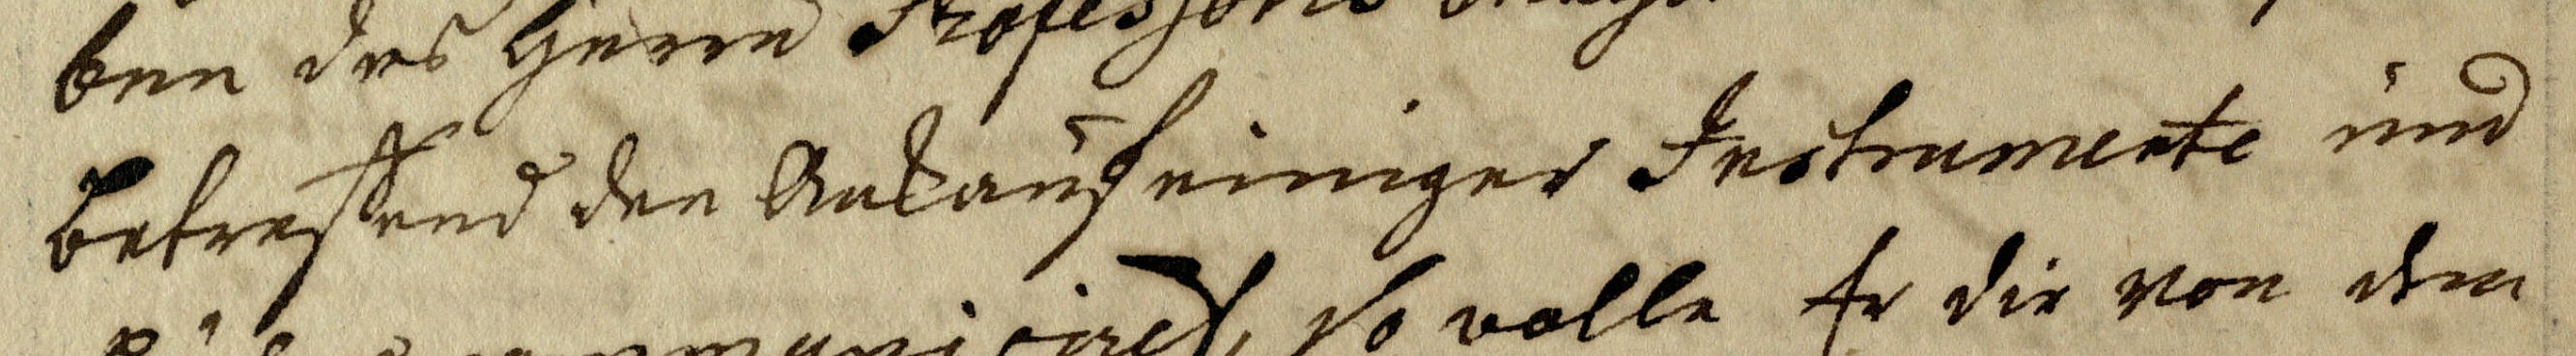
betreffend den Ankauf einiger Instrumente und
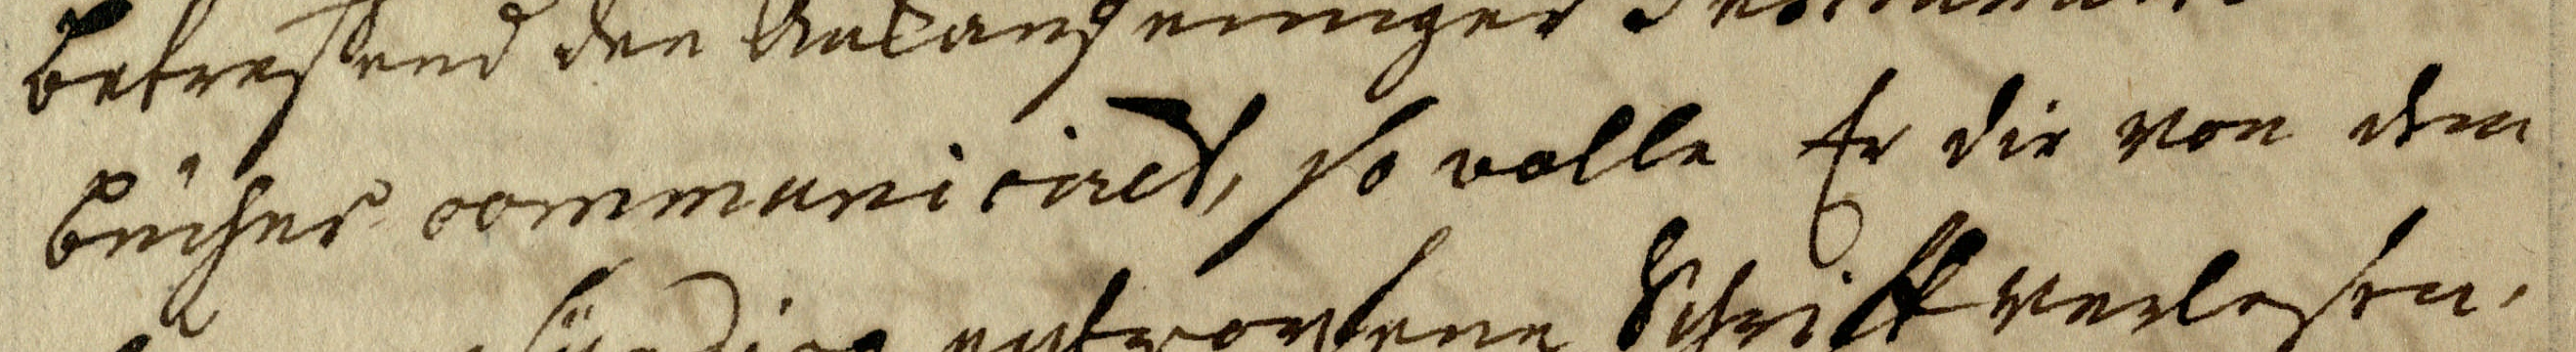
Bücher communiciret, so wolle Er die von dem
